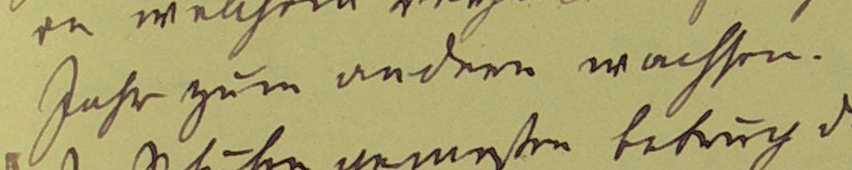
Jahr zum anderen wachsen.
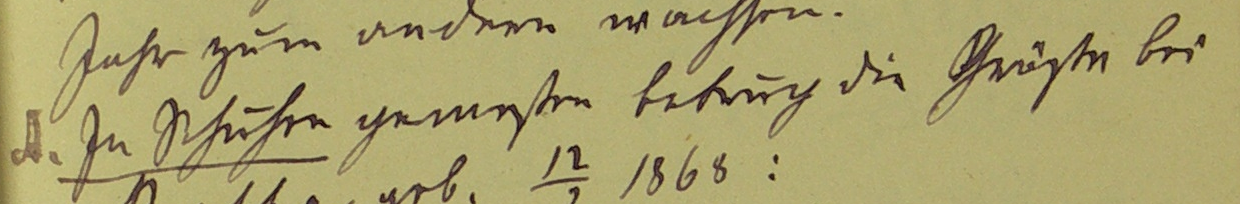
A: In Schuhen gemeßen betrug die Größe bei
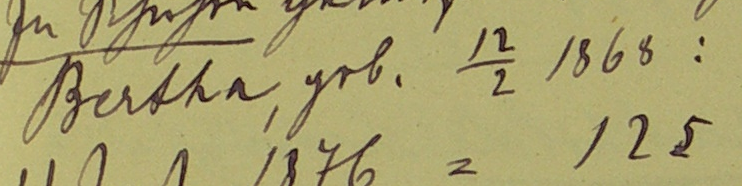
Bertha 12/2 1868:
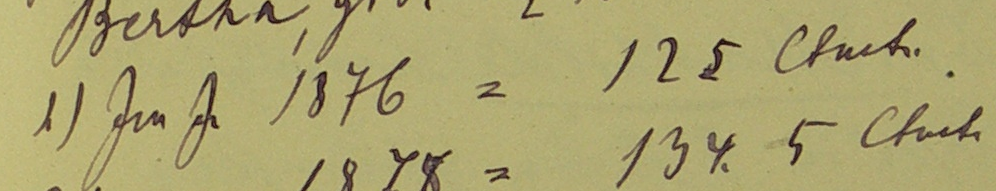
1) Im Jahre 1876 = 125 ctmtr
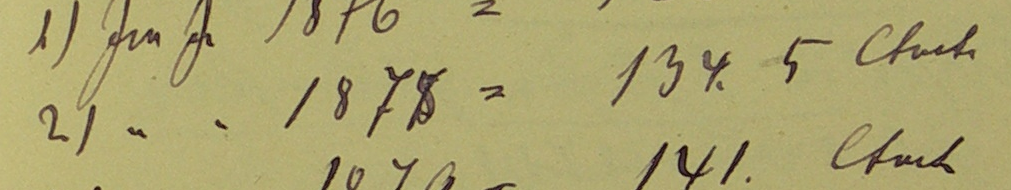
2) 1878 = 134,5 ctmtr
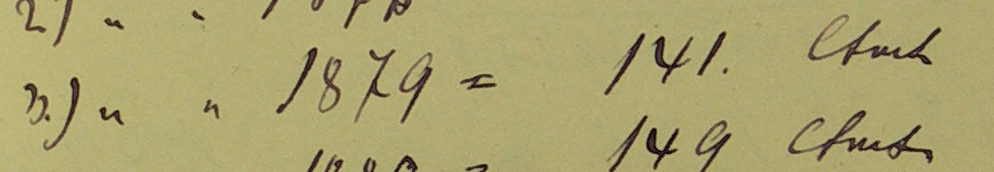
3) 1879 = 141 ctmtr
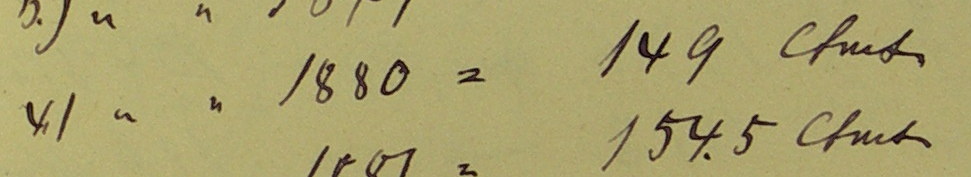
4) 1880 = 149 ctmtr
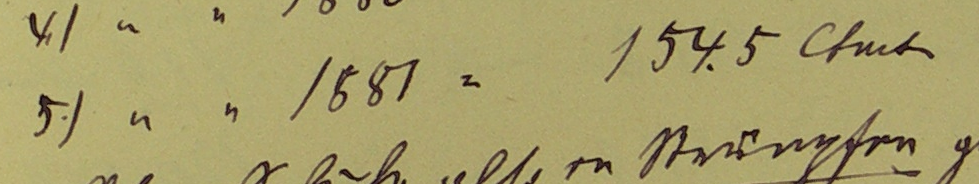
5) 1881 = 154,5 ctmtr
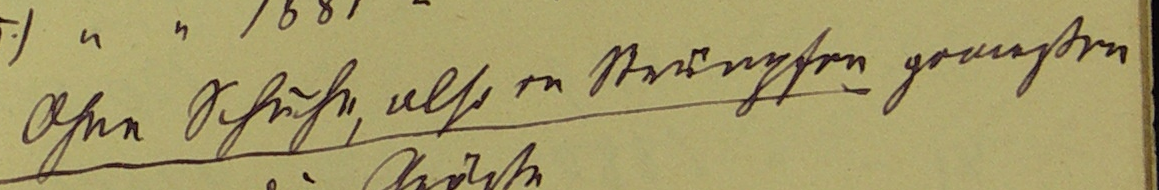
Ohne Schuhe, also in Strümpfen gemeßen
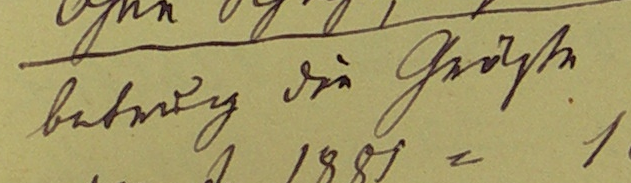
betrug die Größe
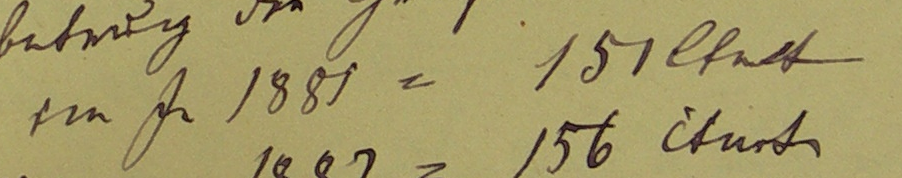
Im Jahr 1881 = 151 ctmtr
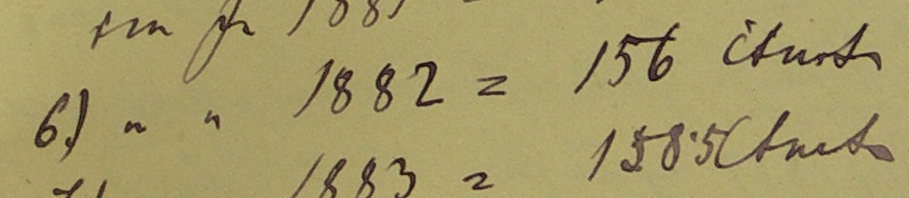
6) 1882 = 156 ctmtr
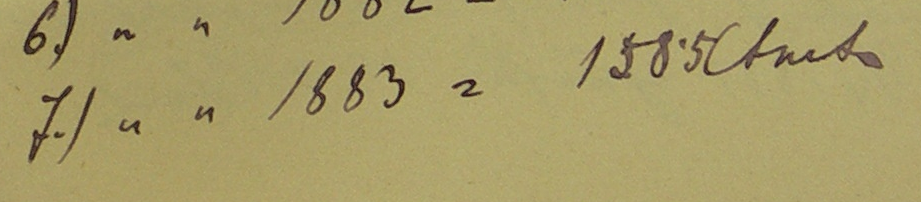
7) 1883 = 158,5 ctmtr
